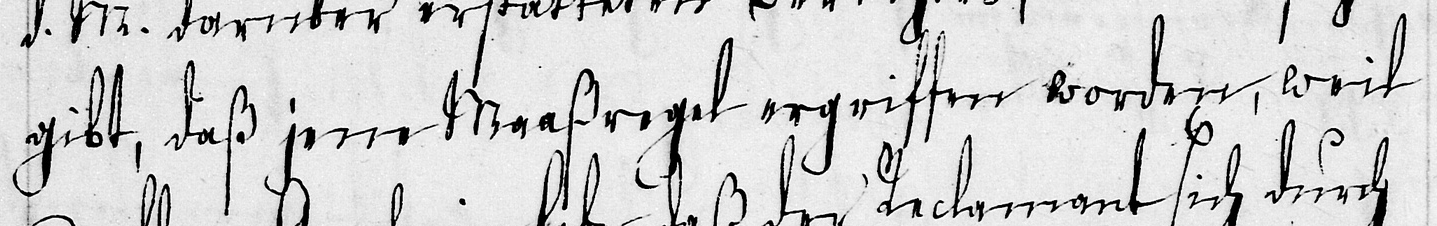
gibt, daß jene Maaßregel ergriffen worden, weil
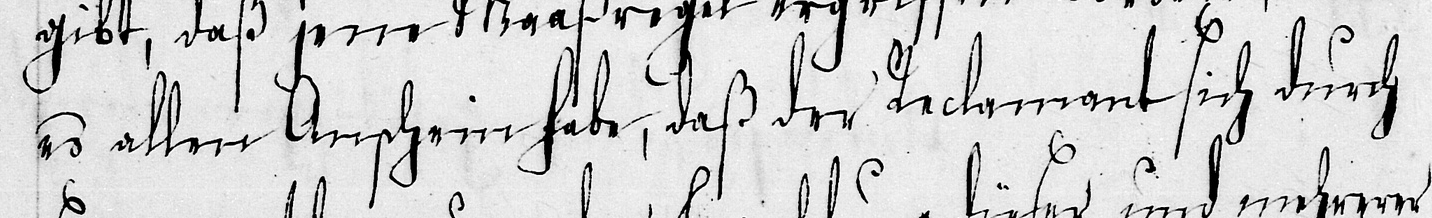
es allen Anschein habe, daß der Reclamant sich durch
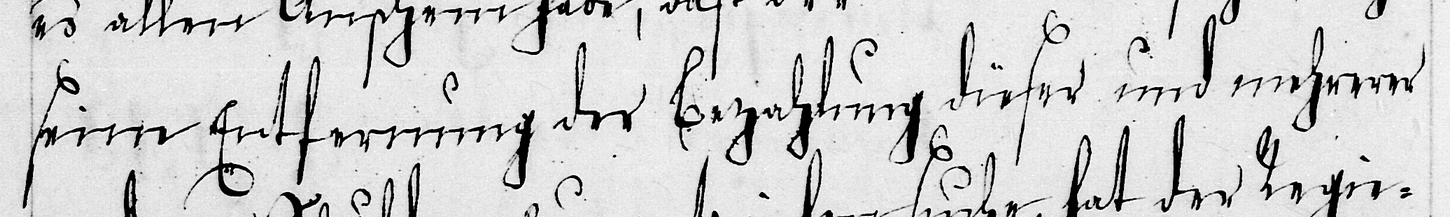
seine Entfernung der Bezahlung dieser und mehrerer
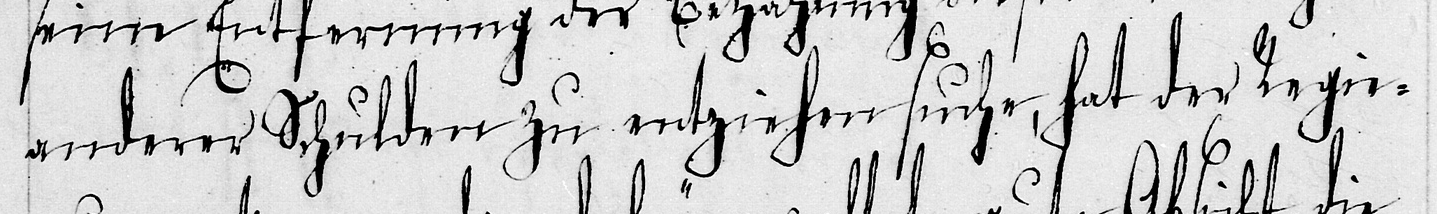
anderer Schulden zu entziehen suche, hat der Regie¬
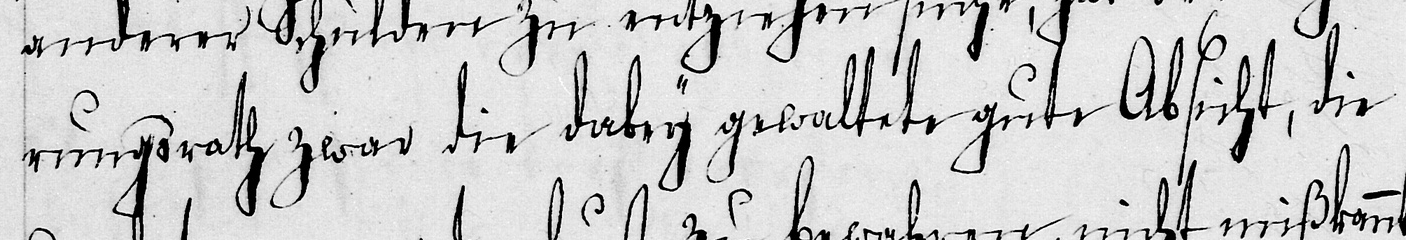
rungsrath zwar die dabey gewaltete gute Absicht, die
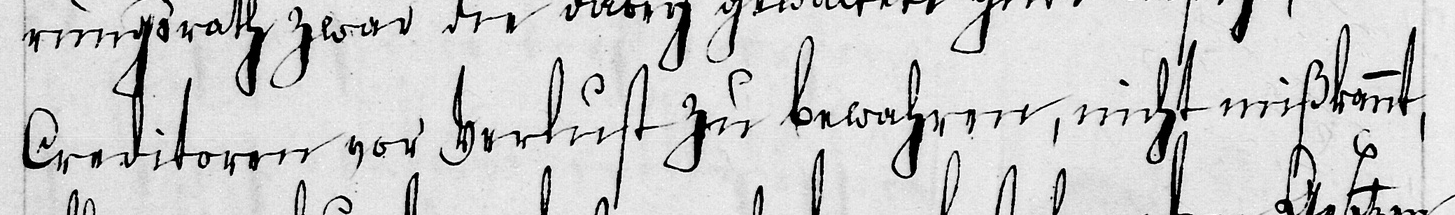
Creditoren vor Verlust zu bewahren, nicht mißkannt,
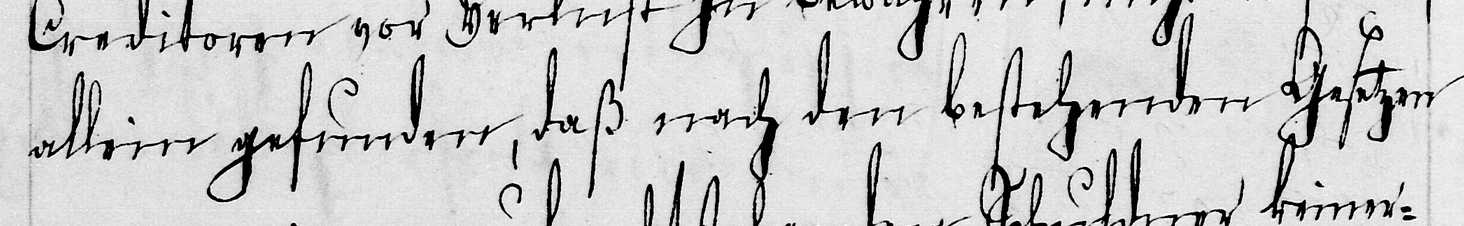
allein gefunden, daß nach den bestehenden Gesetzen
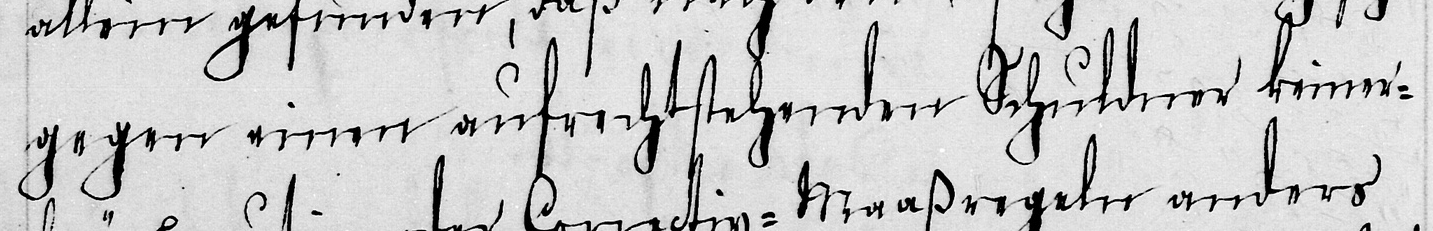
gegen einen aufrechtstehenden Schuldner keiner¬
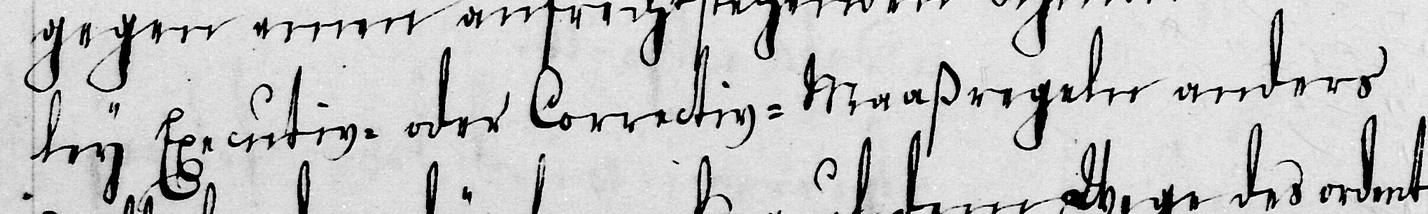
ley Executiv- oder Correctiv-Maaßregeln anders
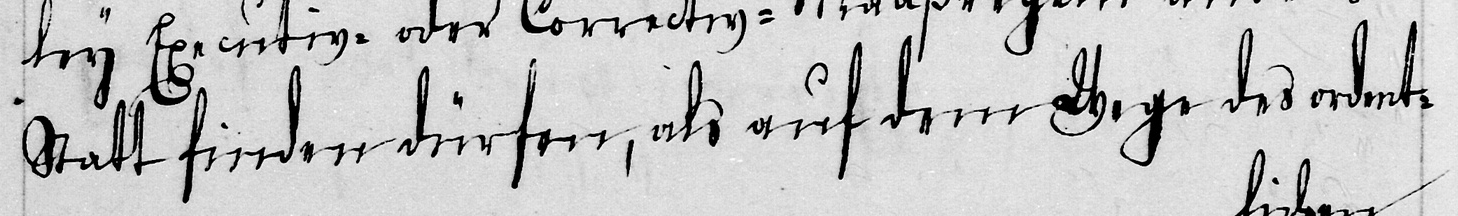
Statt finden dürfen, als auf dem Wege des orden¬
